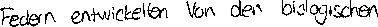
Federn entwickelten. Von den biologischen
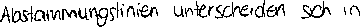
Abstammungslinien unterscheiden sich in
